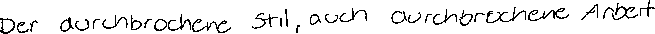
Der durchbrochene Stil, auch durchbrochene Arbeit
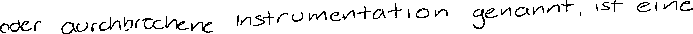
oder durchbrochene Instrumentation genannt, ist eine
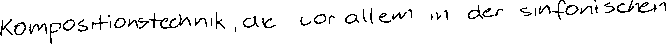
Kompositionstechnik, die vor allem in der sinfonischen
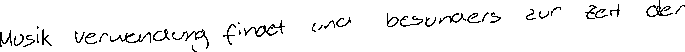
Musik Verwendung findet und besonders zur Zeit der
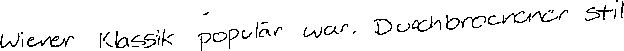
Wiener Klassik populär war. Durchbrochener Stil
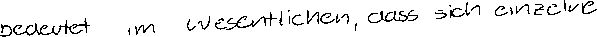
bedeutet im Wesentlichen, dass sich einzelne
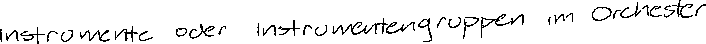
Instrumente oder Instrumentengruppen im Orchester
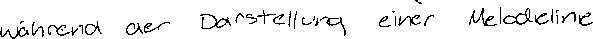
während der Darstellung einer Melodielinie
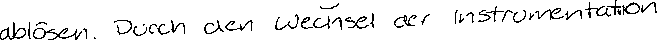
ablösen. Durch den Wechsel der Instrumentation
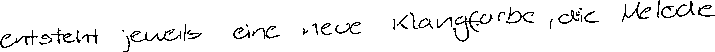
entsteht jeweils eine neue Klangfarbe, die Melodie
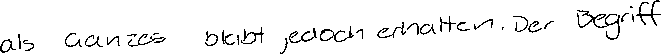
als Ganzes bleibt jedoch erhalten.Der Begriff
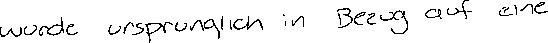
wurde ursprünglich in Bezug auf eine
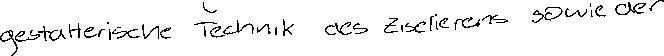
gestalterische Technik des Ziselierens sowie die
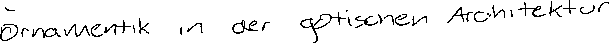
Ornamentik in der gotischen Architektur
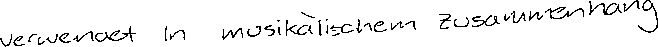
verwendet. In musikalischem Zusammenhang
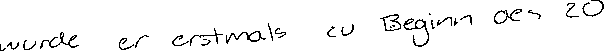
wurde er erstmals zu Beginn des 20
